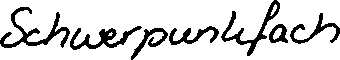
Schwerpunktfach
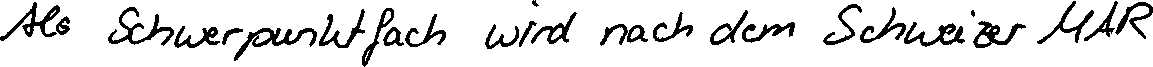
Als Schwerpunktfach wird nach dem Schweizer MAR
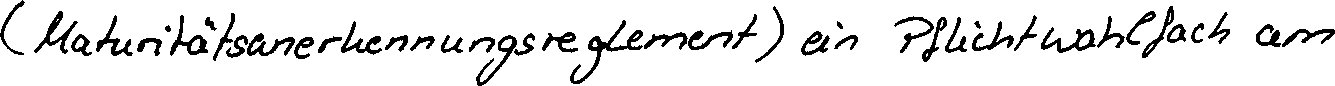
(Maturitätsanerkennungsreglement) ein Pflichtwahlfach am
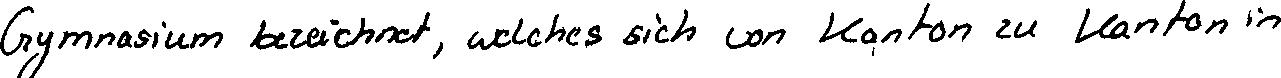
Gymnasium bezeichnet, welches sich von Kanton zu Kanton in
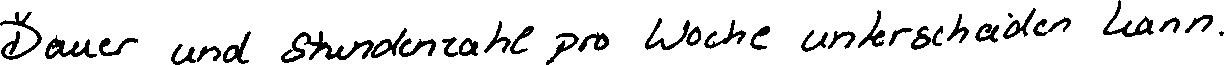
Dauer und Stundenanzahl pro Woche unterscheiden kann.
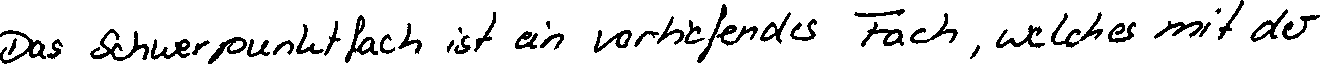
Das Schwerpunktfach ist ein vertiefendes Fach, welches mit der
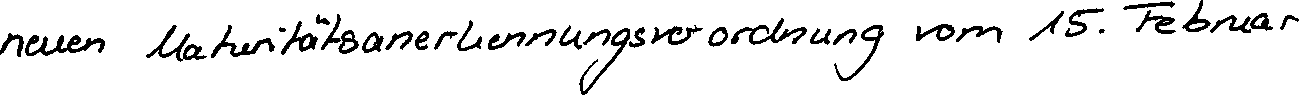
neuen Maturitätsanerkennungsverordnung vom 15. Februar
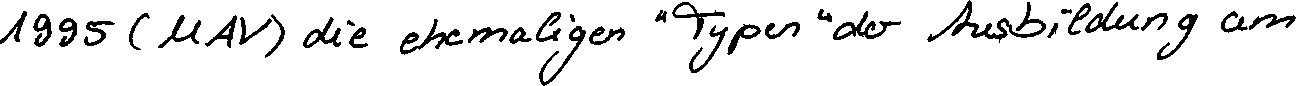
1995 (MAV) die ehemaligen "Typen" der Ausbildung am
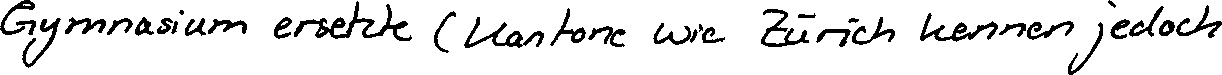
Gymnasium ersetzte (Kantone wie Zürich kennen jedoch
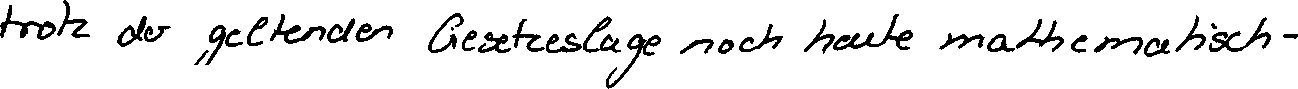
trotz der geltenden Gesetzeslage noch heute mathematisch-
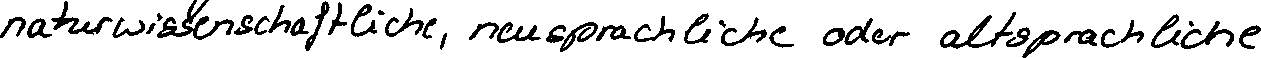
naturwissenschaftliche, neusprachliche oder altsprachliche
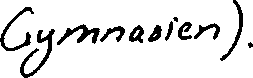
Gymnasien).
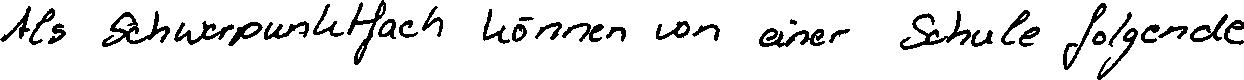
ls Schwerpunktfach können von einer Schule folgende
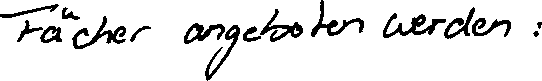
Fächer angeboten werden:
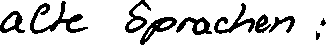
alte Sprachen:
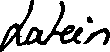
Latein
